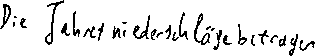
Die Jahresniederschläge betragen
